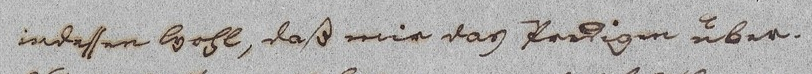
indessen wohl, daß mir das Predigen über-
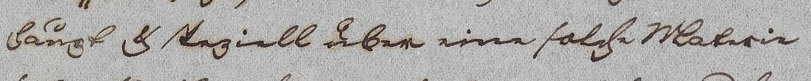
haupt & speziell über eine solche Materie
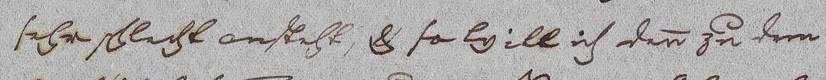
sehr schlecht ansteht, & so will ich denn zu dem
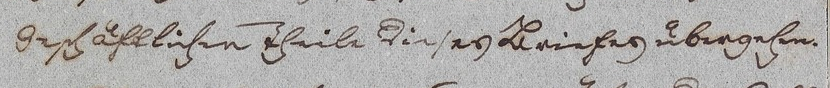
geschäftlichen Theile dieses Briefes übergehen.
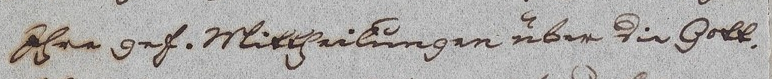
Ihre gef. Mittheilungen über die Gott-
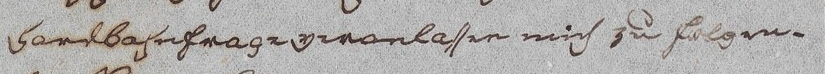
hardbahnfrage veranlassen mich zu folgen-
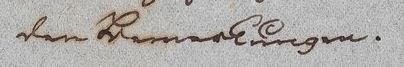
den Bemerkungen.
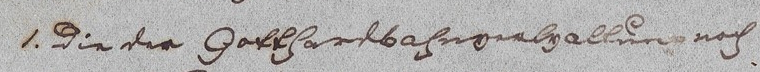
1. Die der Gotthardbahnverwaltung noch
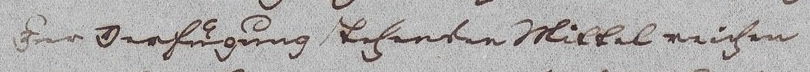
zur Verfügung stehenden Mittel reichen
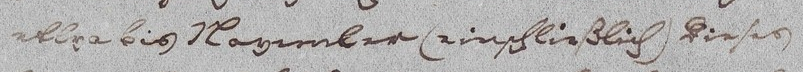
etwa bis November (einschließlich) dieses
